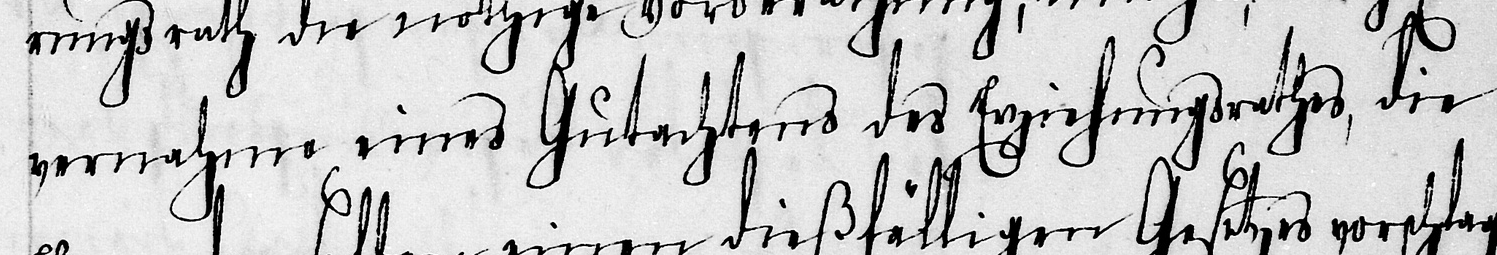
vernahme eines Gutachtens des Erziehungsrathes, die
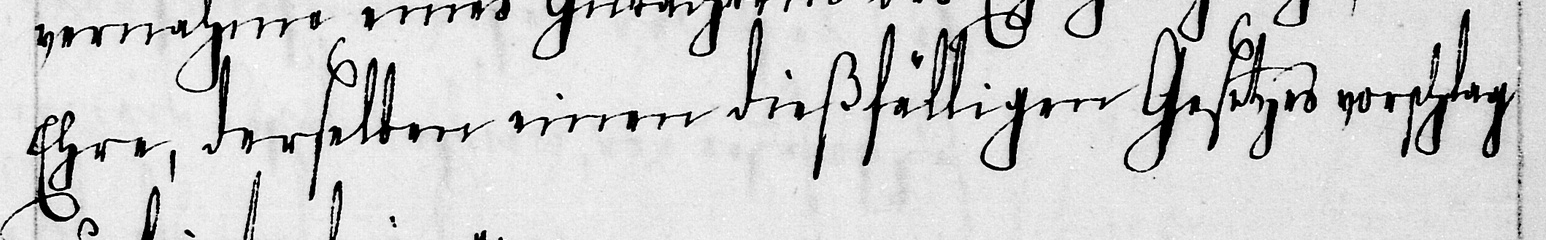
Ehre, derselben einen dießfälligen Gesetzesvorschlag
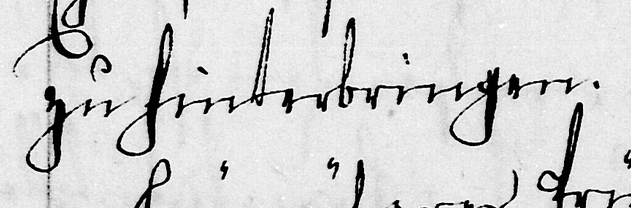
zu hinterbringen.
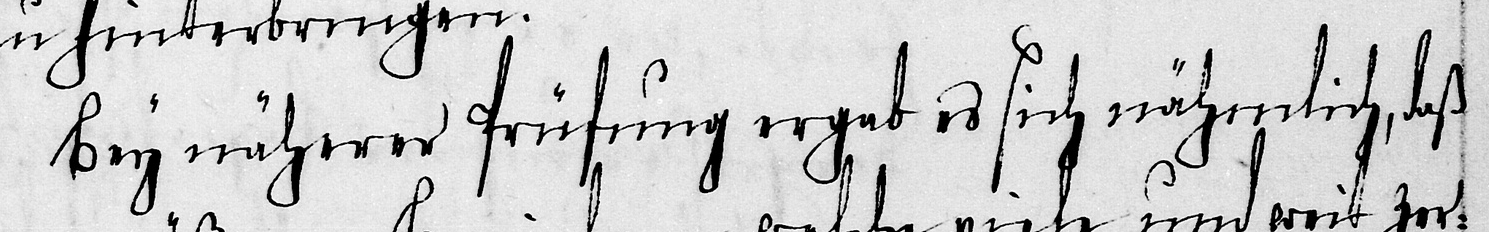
Bey näherer Prüfung ergab es sich nähmlich, daß
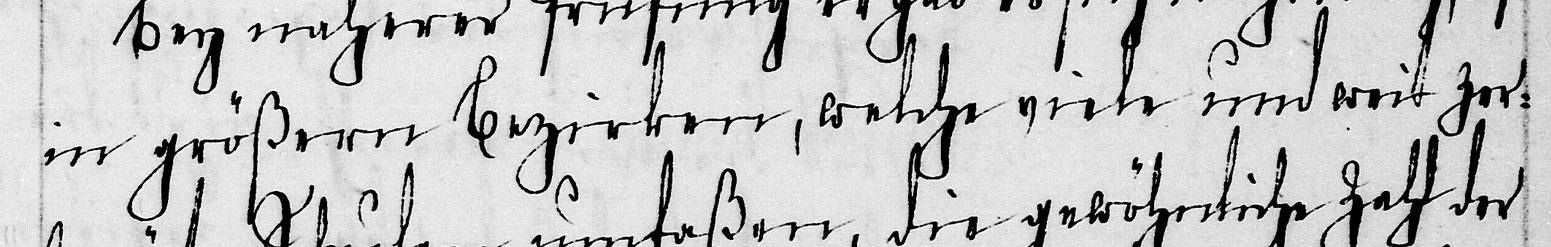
in größern Bezirken, welche viele und weit zers¬
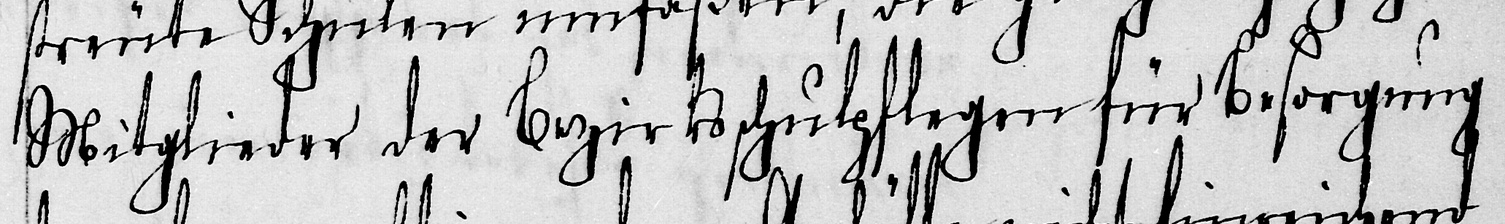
Mitglieder der Bezirksschulpflegen für Besorgung
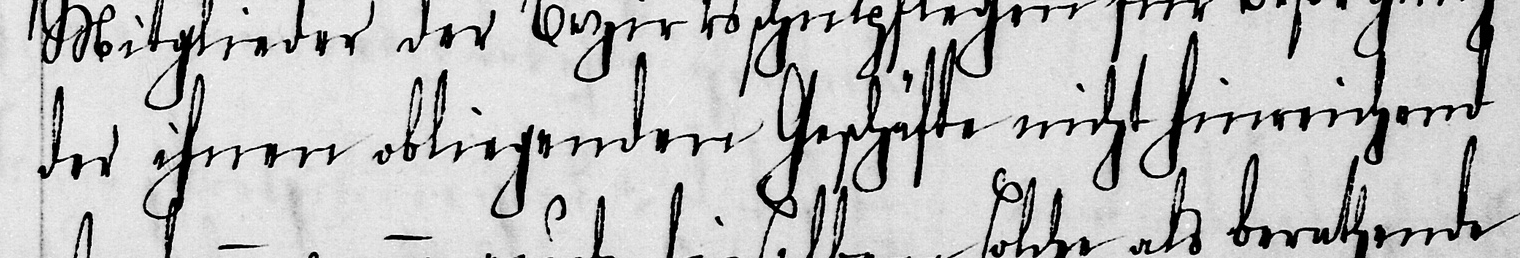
der ihnen obliegenden Geschäfte nicht hinreichend
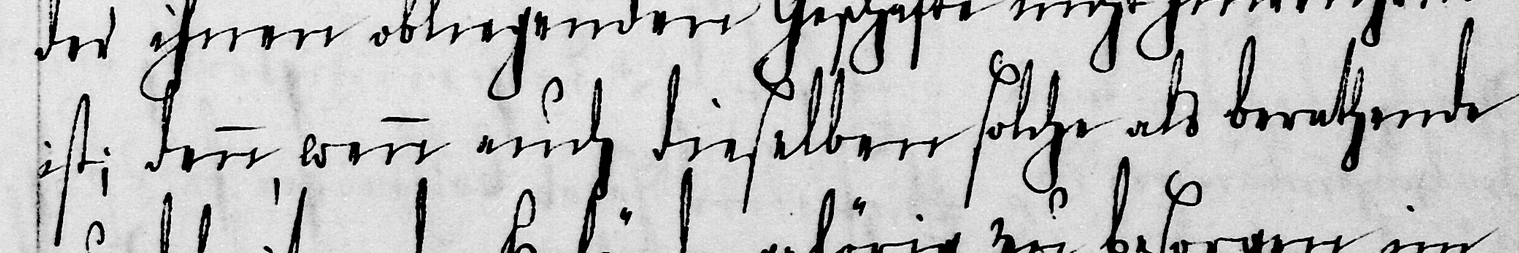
ist; denn, wenn auch dieselben solche als berathende
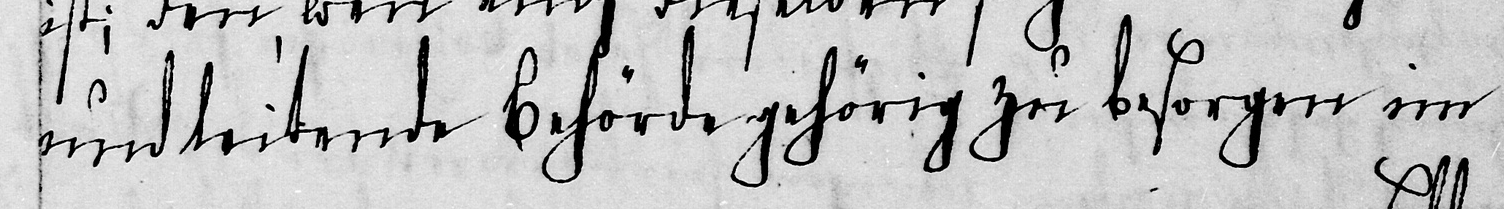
und leitende Behörde gehörig zu besorgen im
